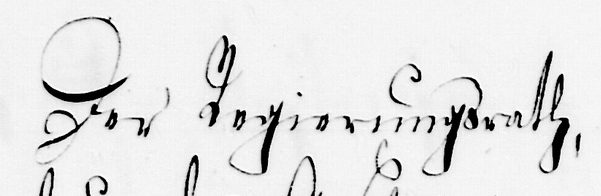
Der Regierungsrath,
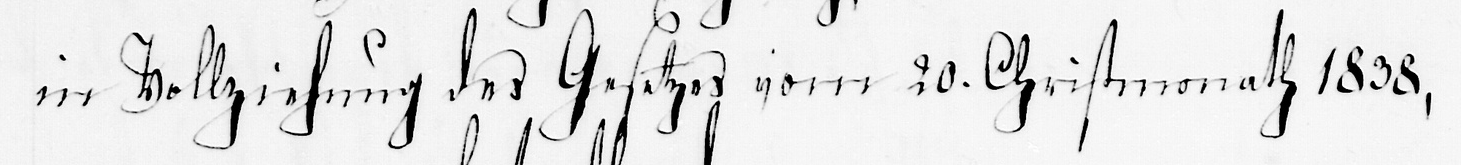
in Vollziehung des Gesetzes vom 20. Christmonath 1838,
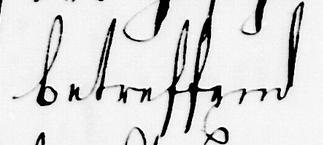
betreffend
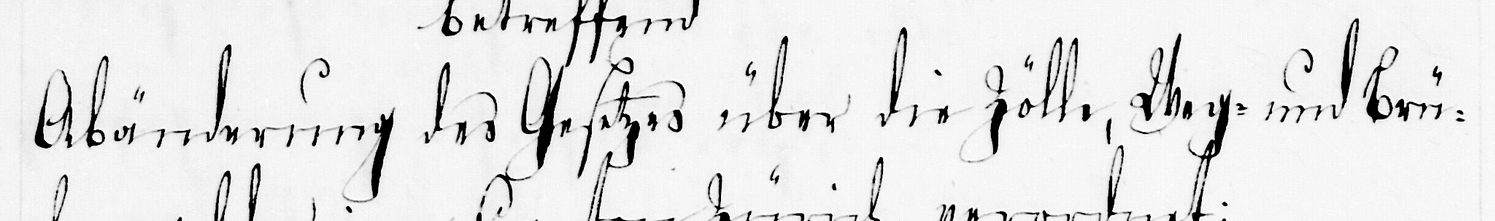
Abänderung des Gesetzes über die Zölle, Weg- und Brü¬
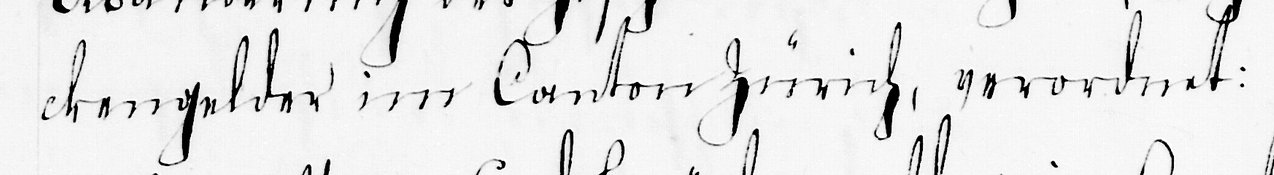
ckengelder im Canton Zürich, verordnet:
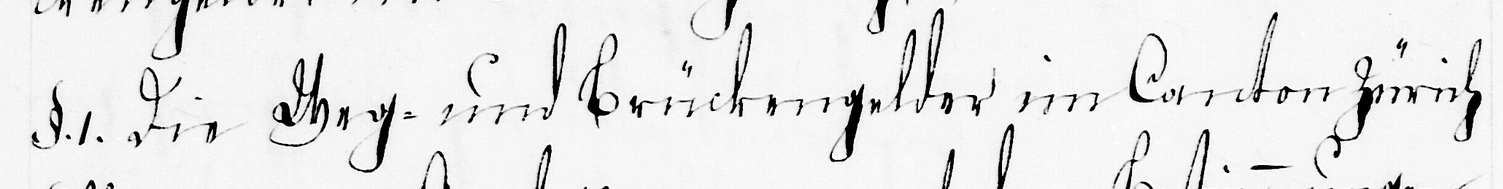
1. Die Weg- und Brückengelder im Canton Zürich
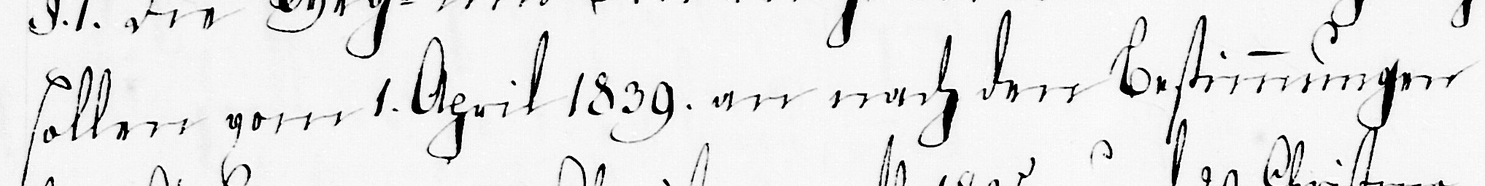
sollen vom 1. April 1839. an nach den Bestimmungen
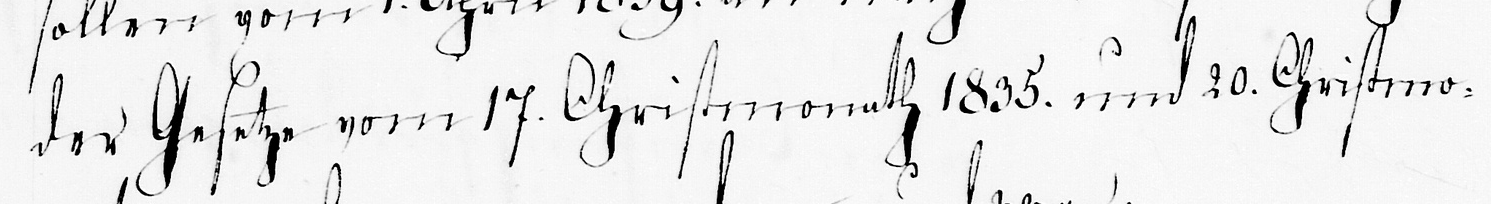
der Gesetze vom 17. Christmonath 1835. und 20. Christmo¬
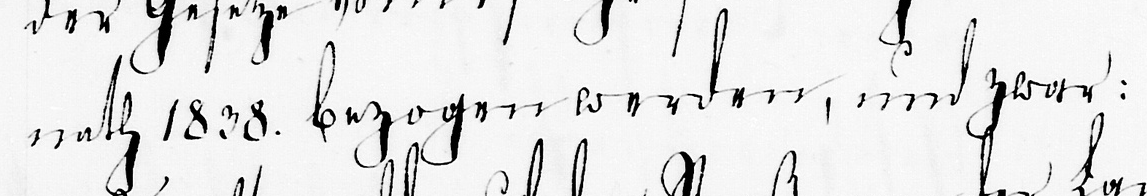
nath 1838. bezogen werden, und zwar:
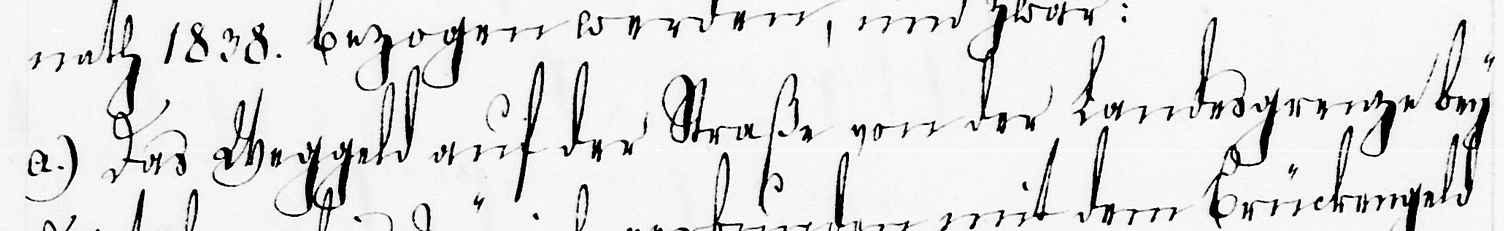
a.) Das Weggeld auf der Straße von der Landesgrenze bey
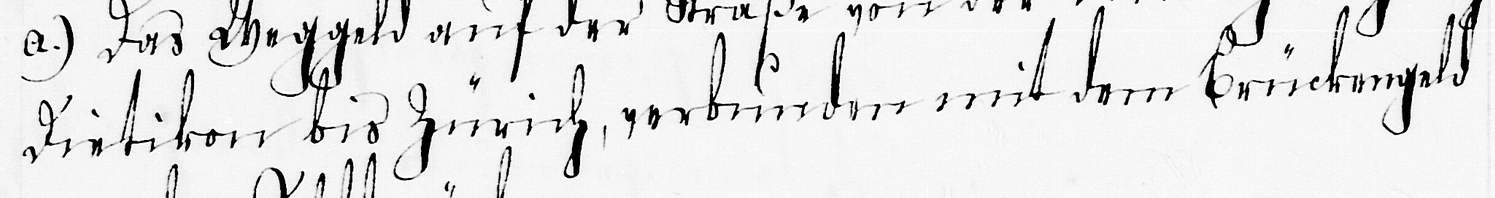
Dietikon bis Zürich, verbunden mit dem Brückengeld
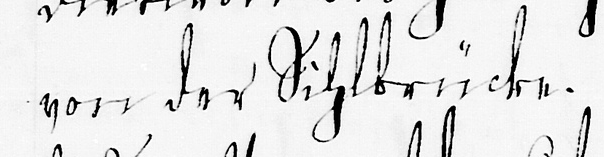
von der Sihlbrücke.
